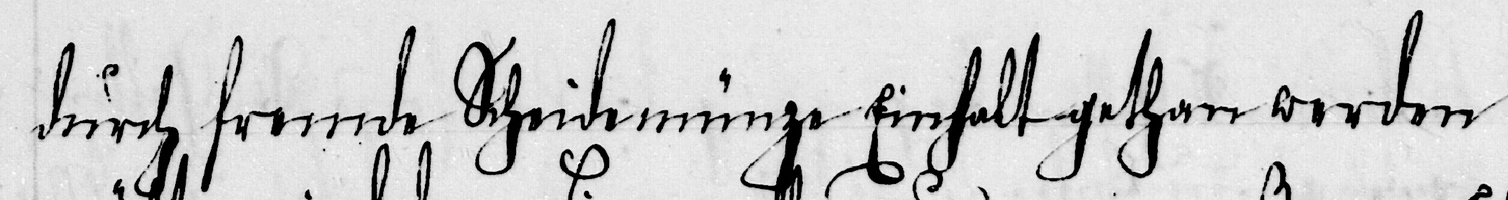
durch fremde Scheidemünze Einhalt gethan werden
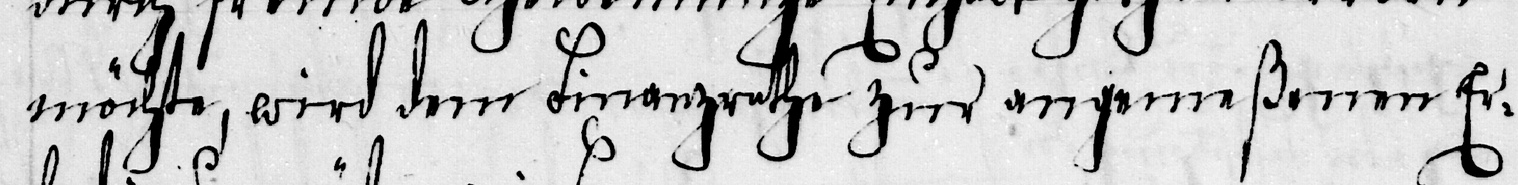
möchte, wird dem Finanzrathe zur angemeßenen Er¬
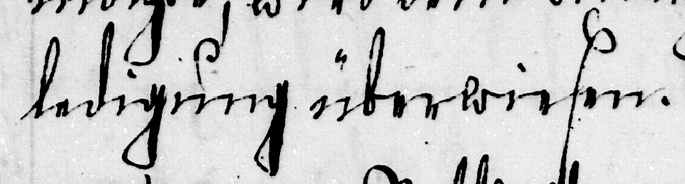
ledigung überwiesen.
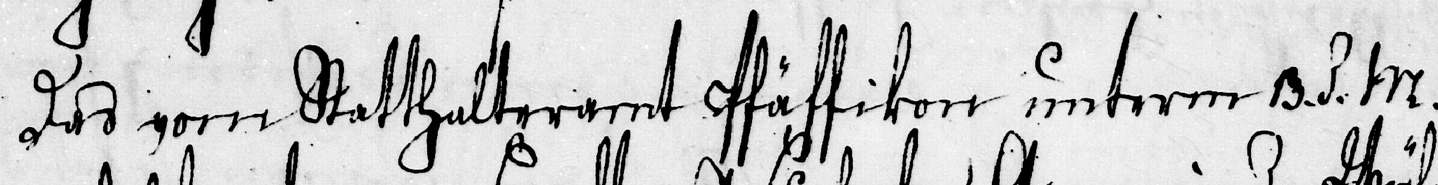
Das vom Statthalteramte Pfäffikon unterm 13. d. M.
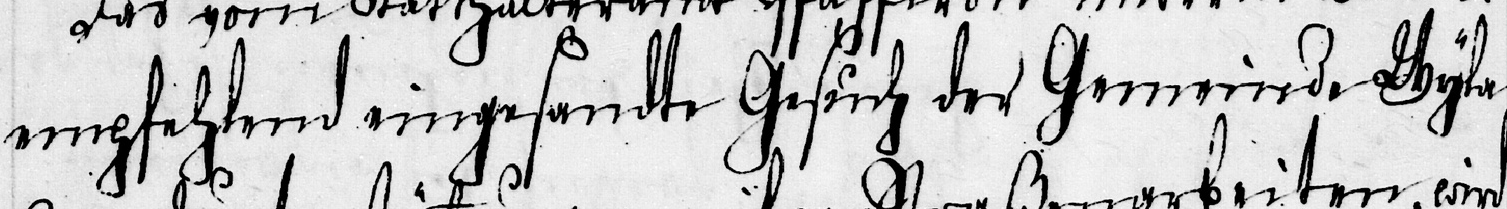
empfehlend eingesandte Gesuch der Gemeinde Wyla
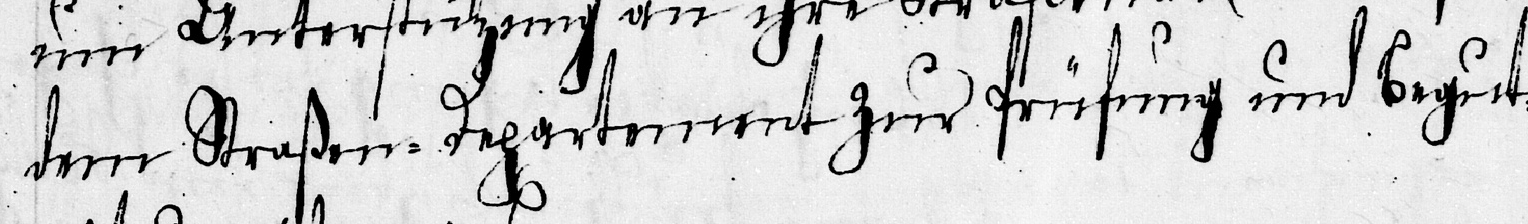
dem Straßen-Departement zur Prüfung und Begut¬
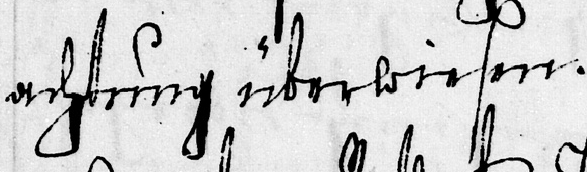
achtung überwiesen.
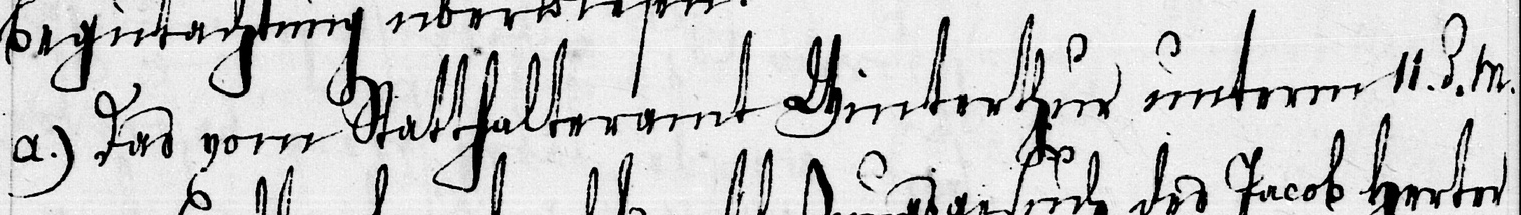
a.) Das vom Statthalteramt Winterthur unterm 11. d.
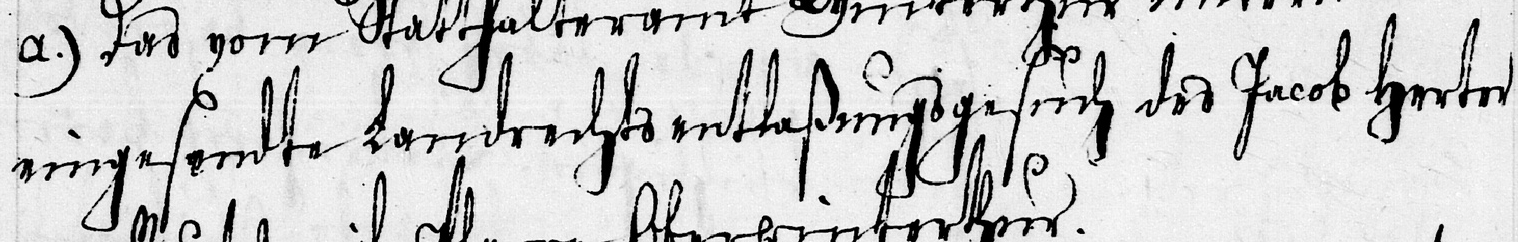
eingesandte Landrechtsentlaßungsgesuch des Jacob Herter
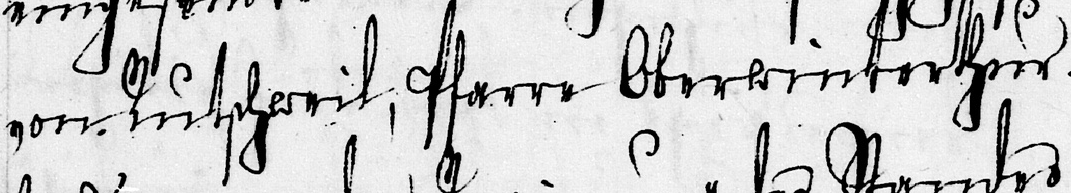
von Rutschweil, Pfarre Oberwinterthur.
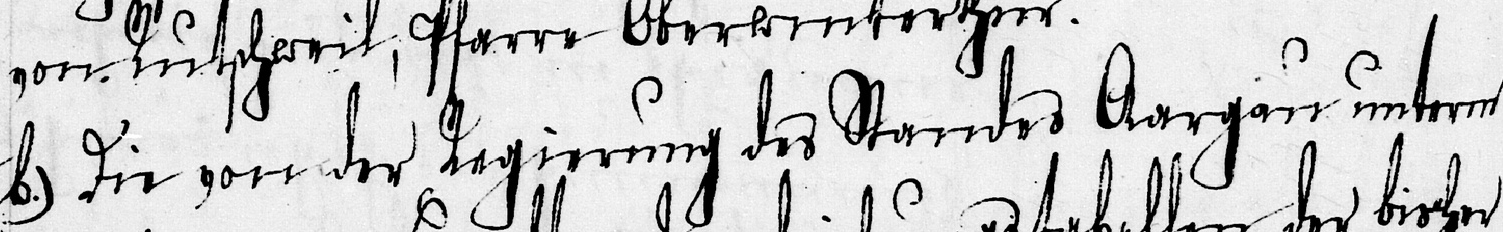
b.) Die von der Regierung des Standes Aargau unterm
